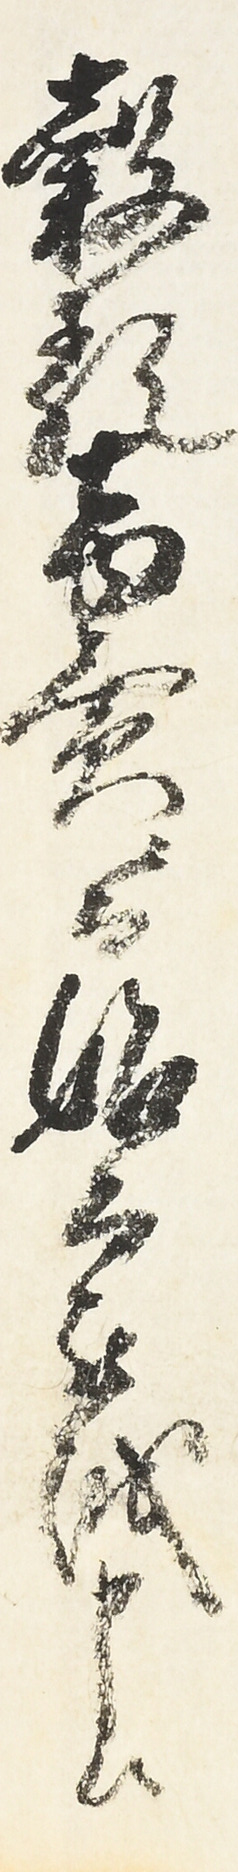穀類商売ニ而始而罷越申候
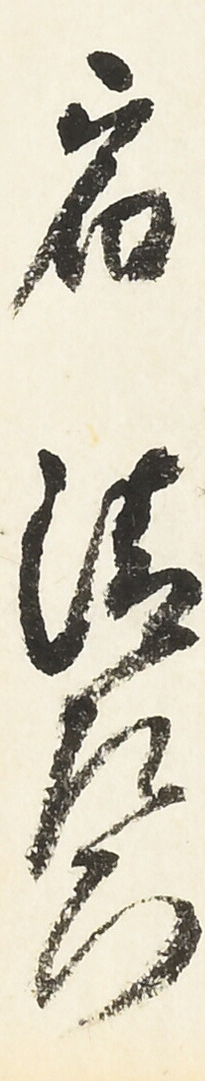宿清左衛門
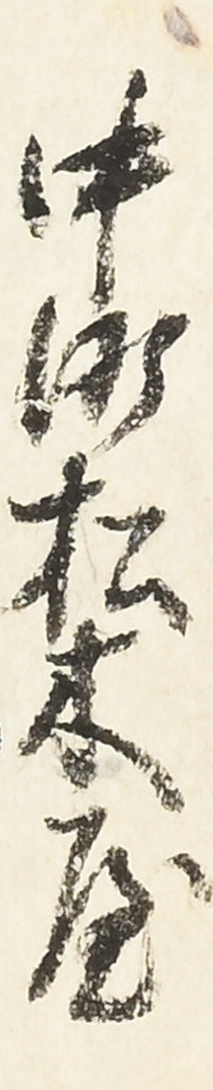中町松木屋
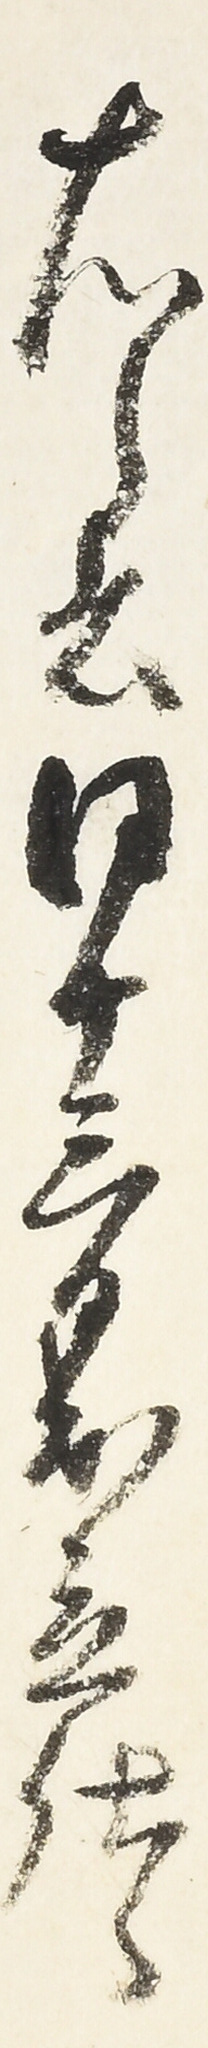右之者同十三日出立仕候
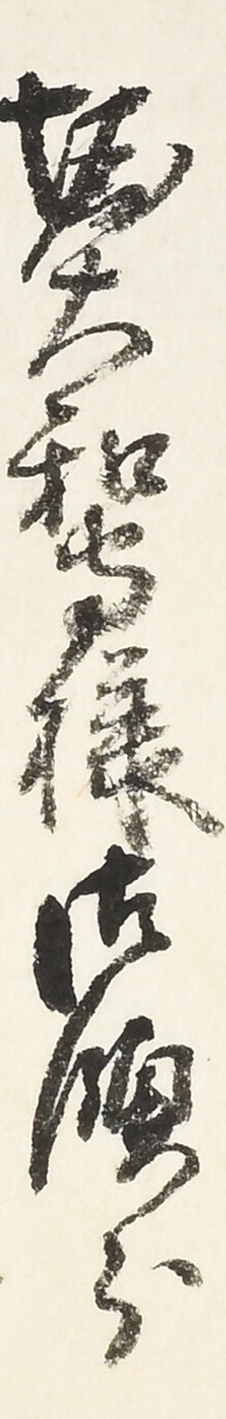堀大和守様御領分
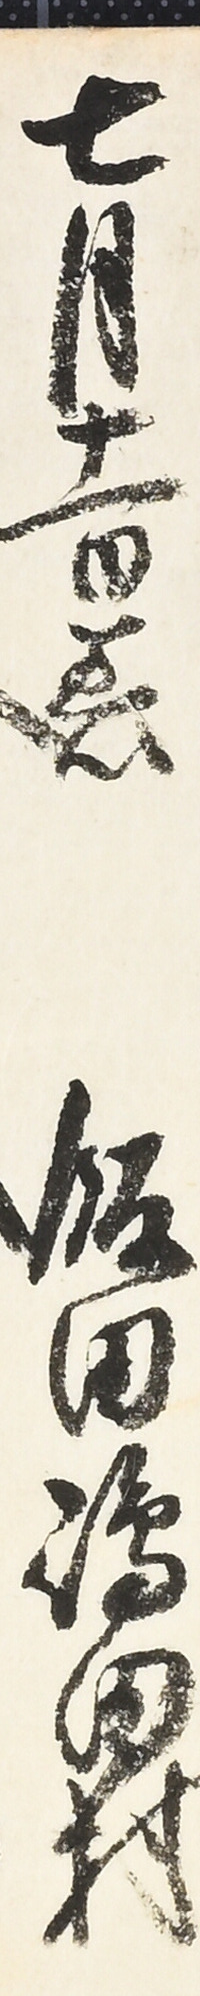七月十一日着飯田嶋田村
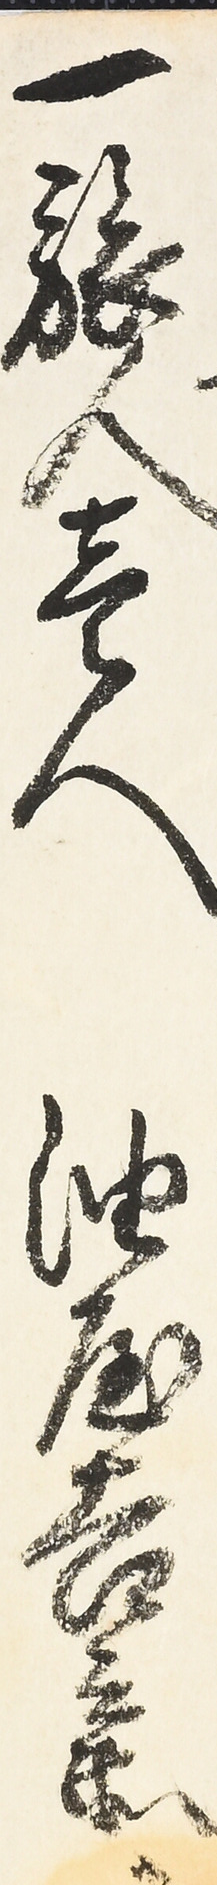一旅人壱人油屋吉兵衛
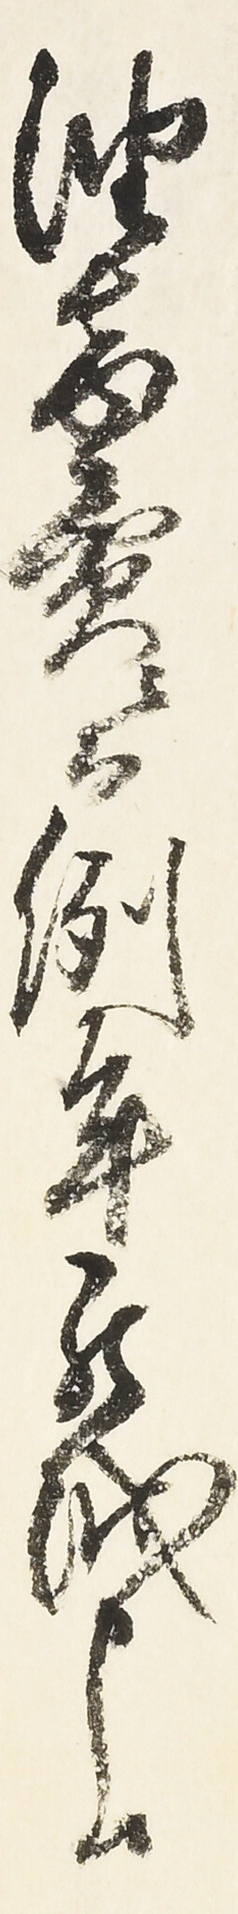油商売ニ而例年罷越申候
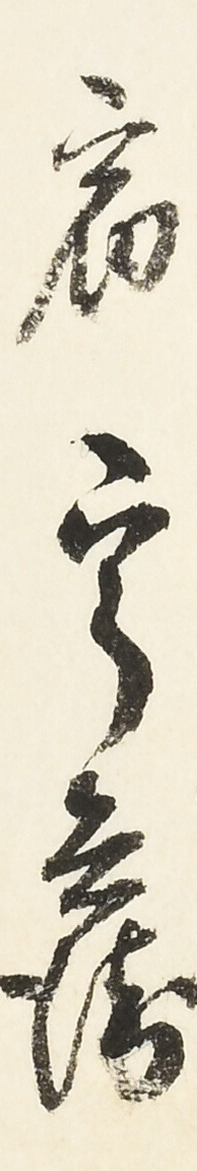宿宇兵衛
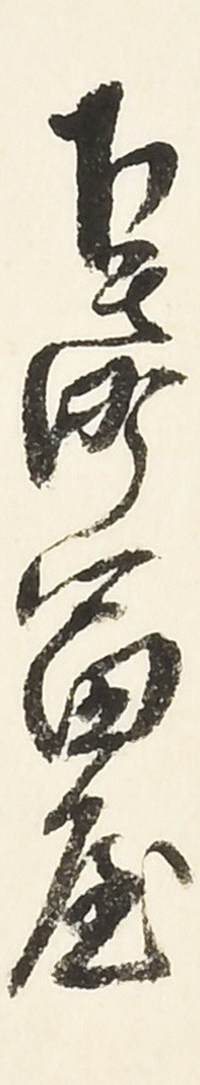下モ町冨屋
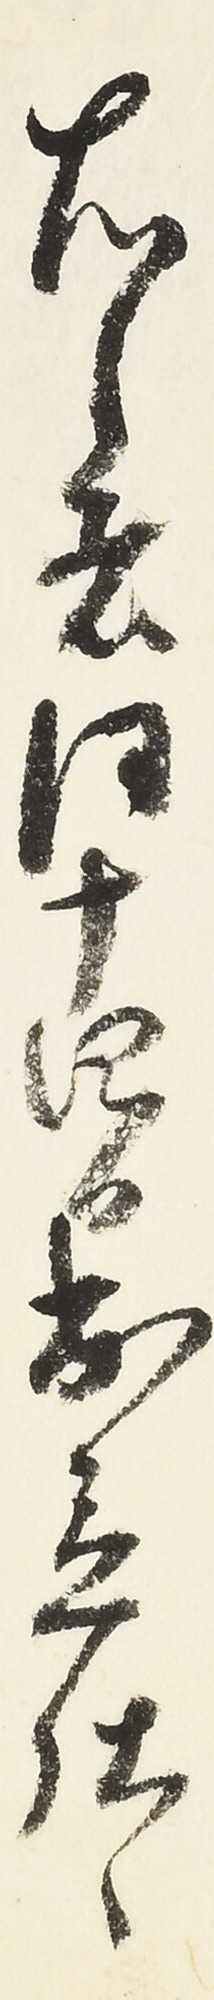右之者同十四日出立仕候
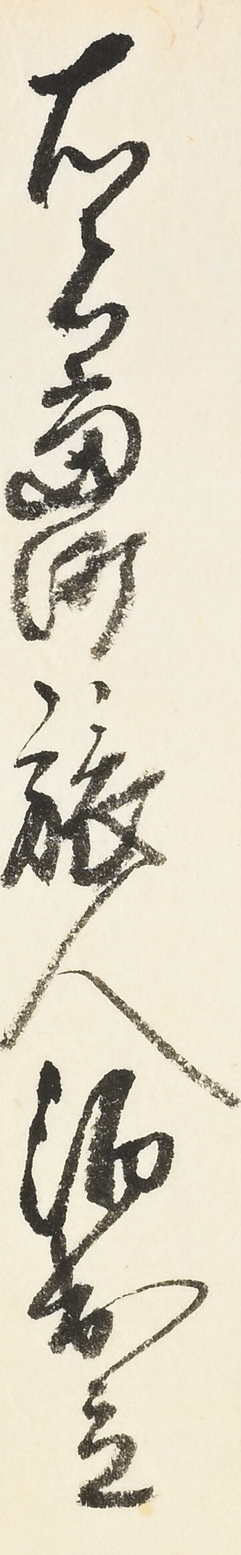右者当町旅人泊出立
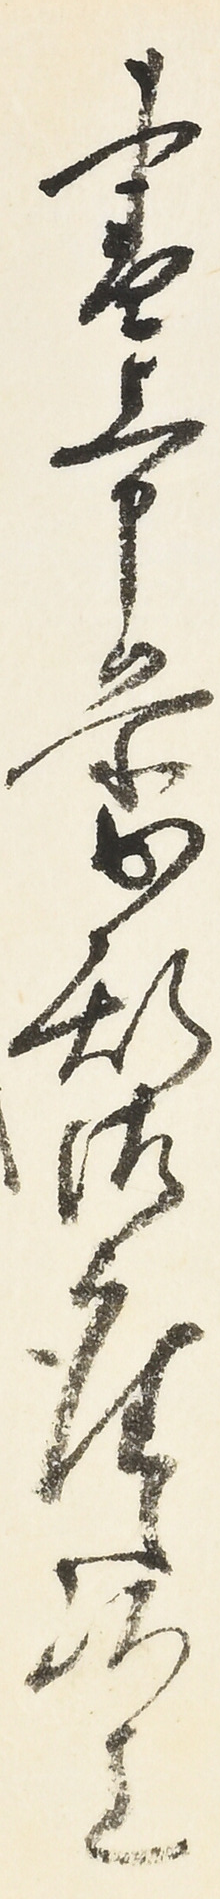書上申候所如斯御座候以上
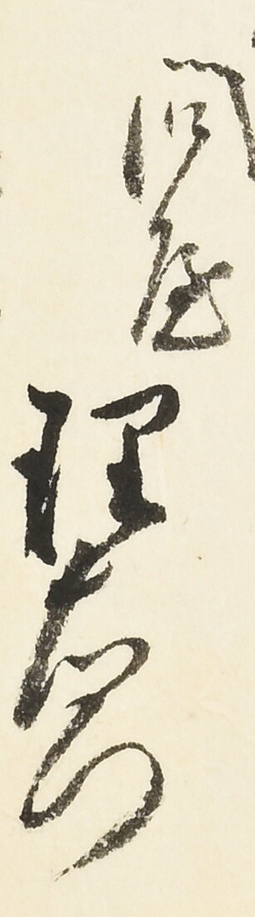酉理右衛門
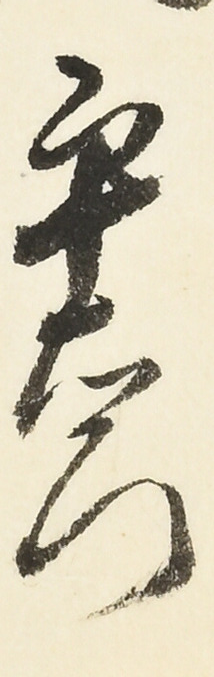平右衛門
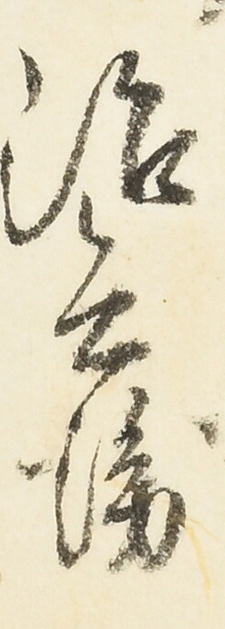治兵衛
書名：町中旅人泊控帳
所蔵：伊那市立高遠町図書館・合同会社AMANE
